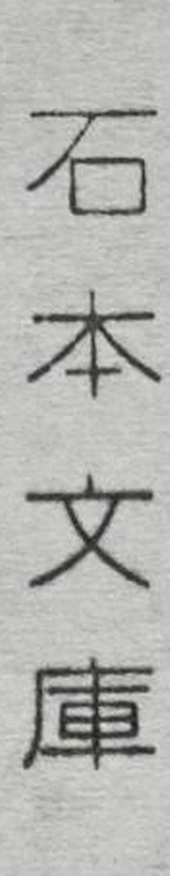石本文庫
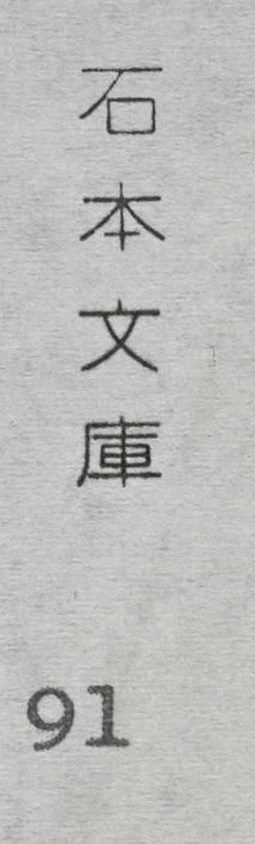石本文庫

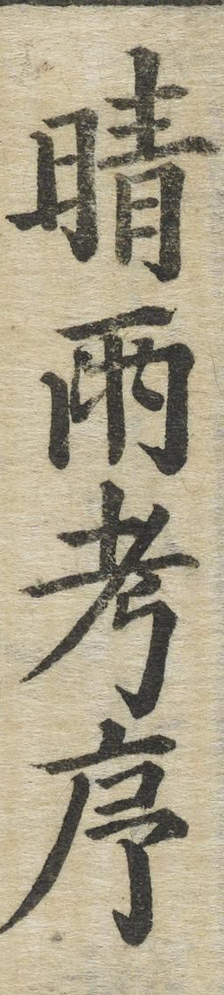晴雨考序

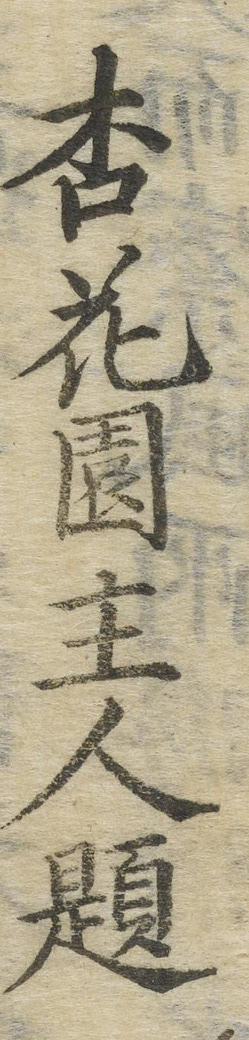杏花園主人題
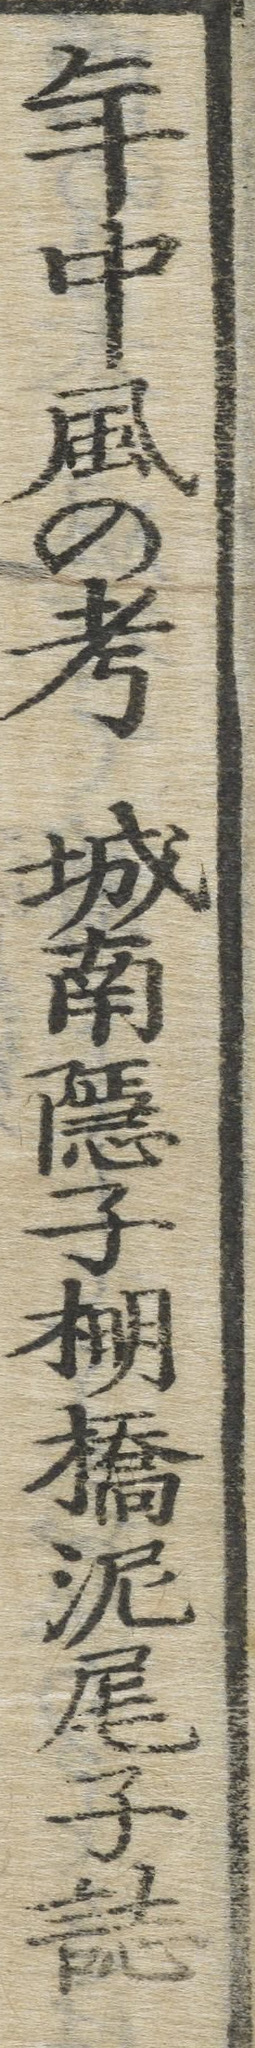年中風の考城南隠子棚橋泥尾子誌
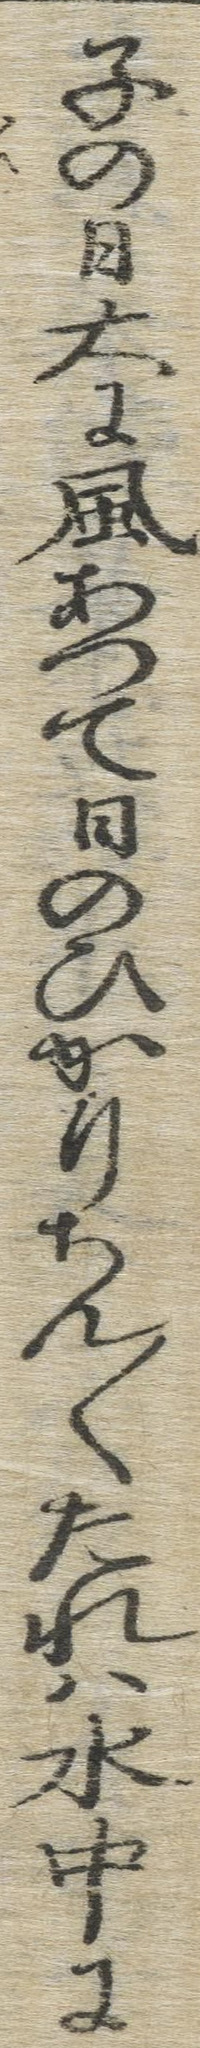子の日大に風あつて日のひかりちん〳〵たれは水中に
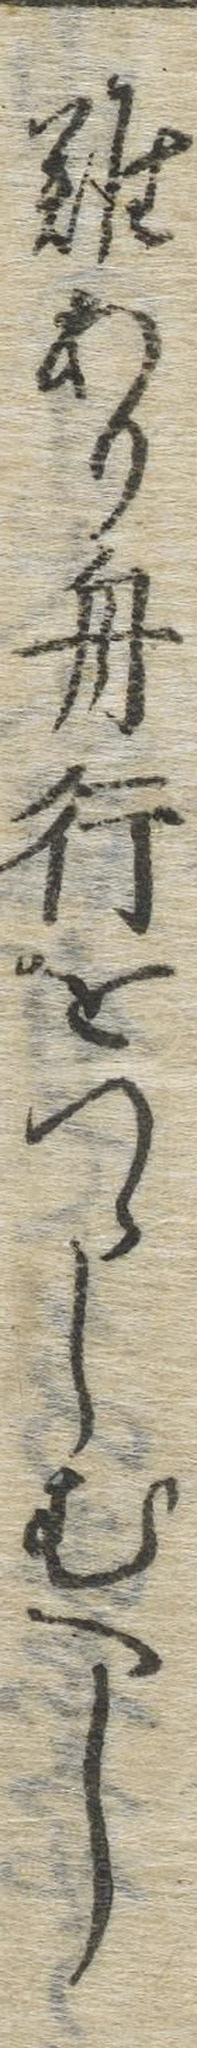難あり舟行をつゝしむへし
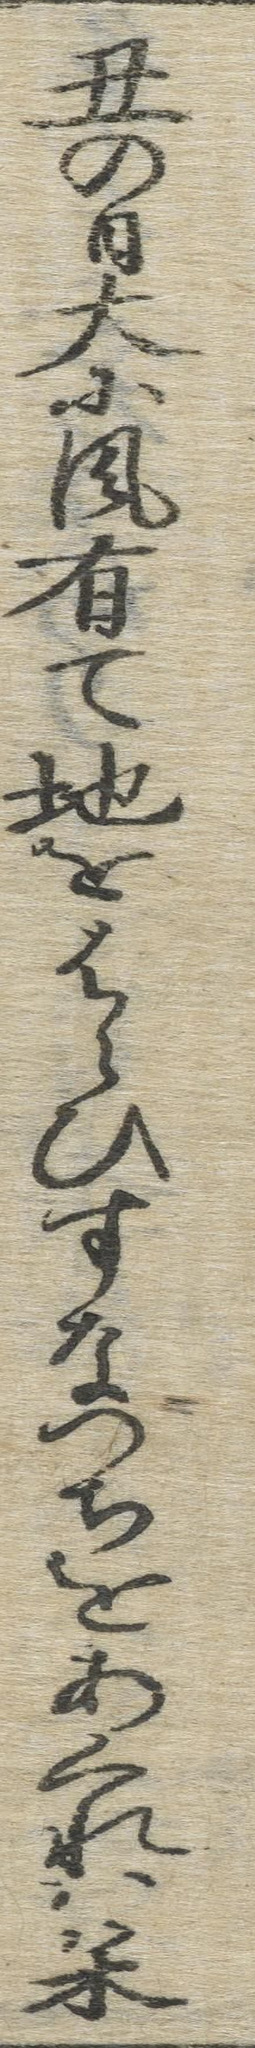丑の日大に風有て地をはらひすなつちをあくれは米
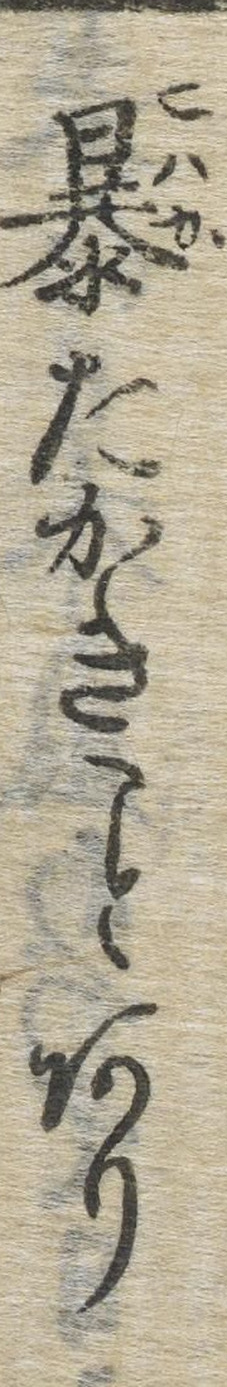暴たかきことあり
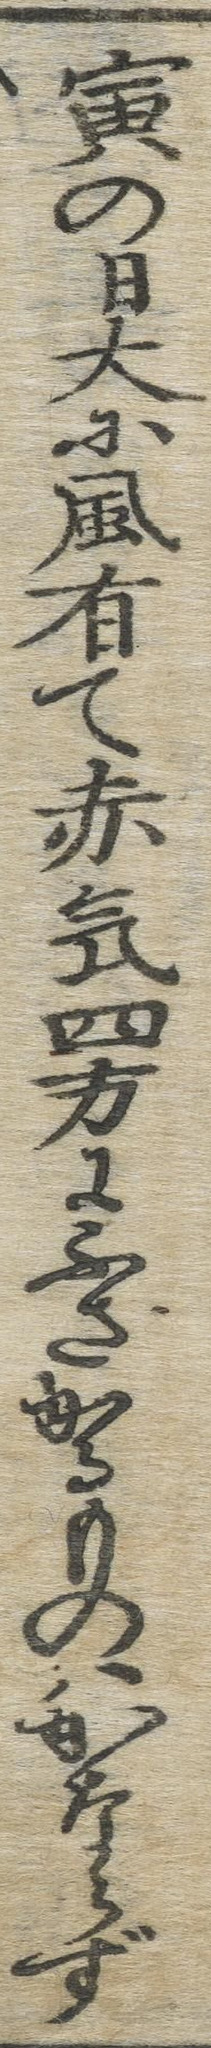寅の日大に風有て赤気四方にふさかるものはかならず
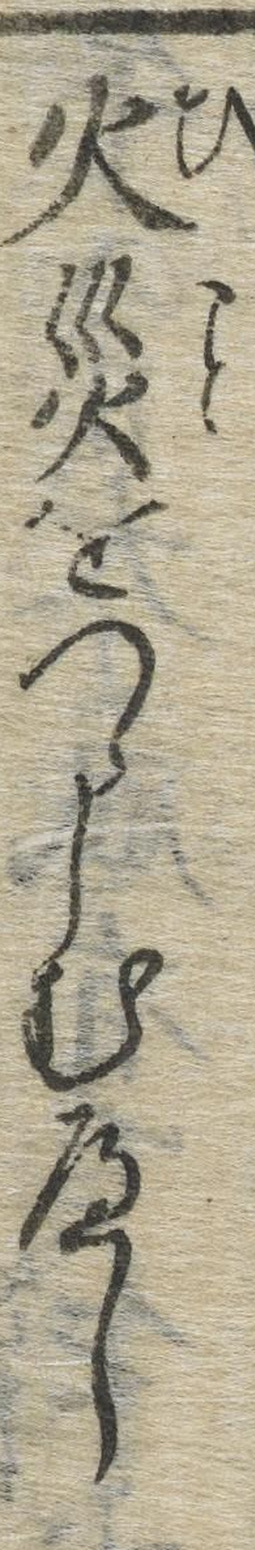火災をつゝしむへし
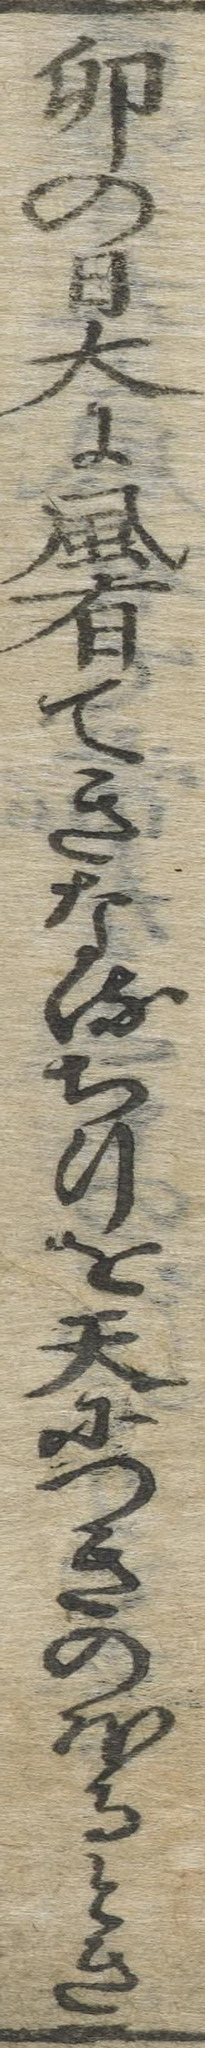卯の日大に風有てきなるちりを天につきのほるとき
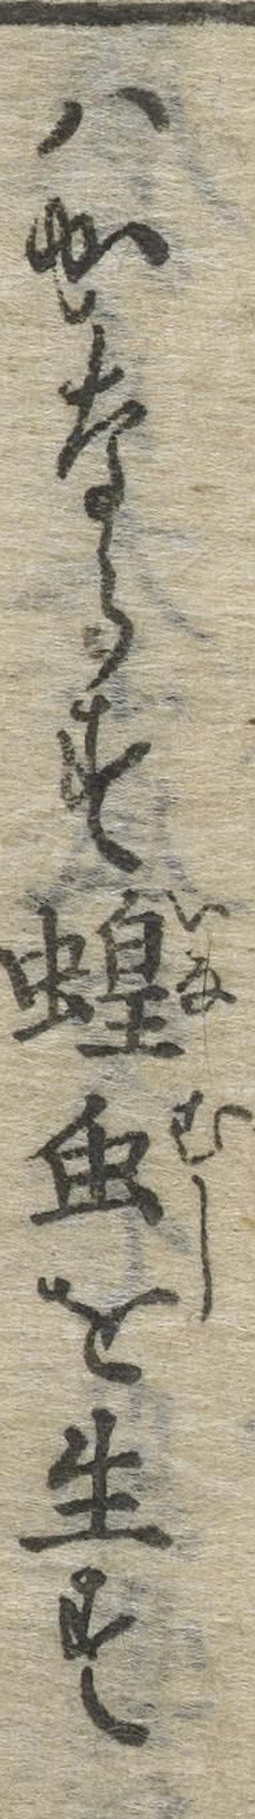はかならす蝗虫を生す

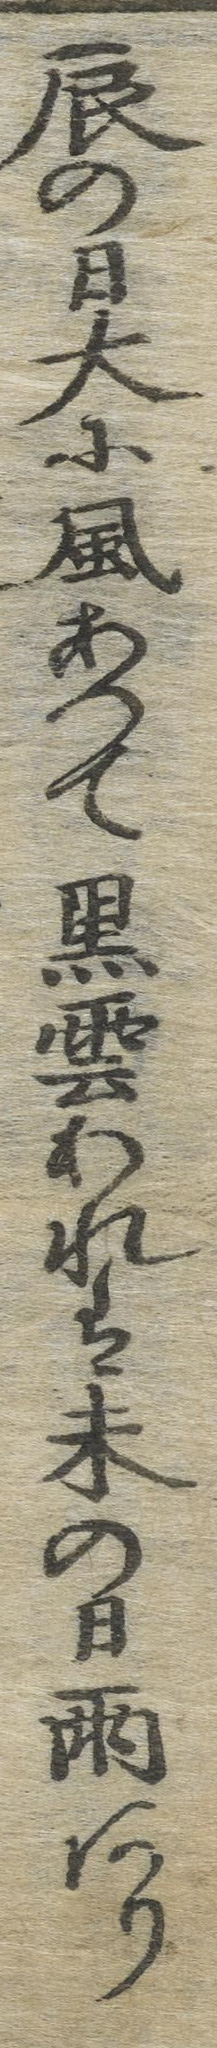辰の日大に風あつて黒雲あれは未の日雨あり
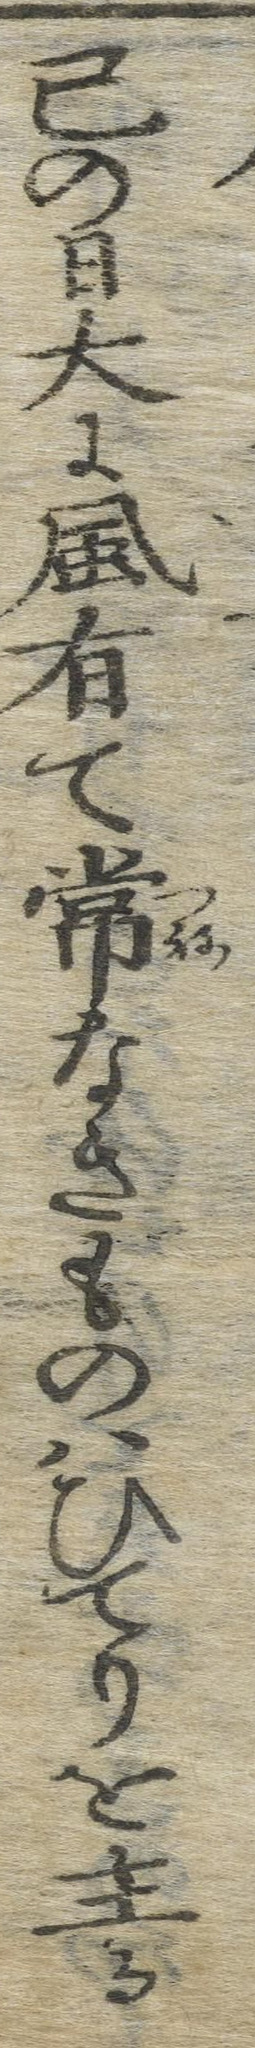巳の日大に風有て常なきものはひてりを主る
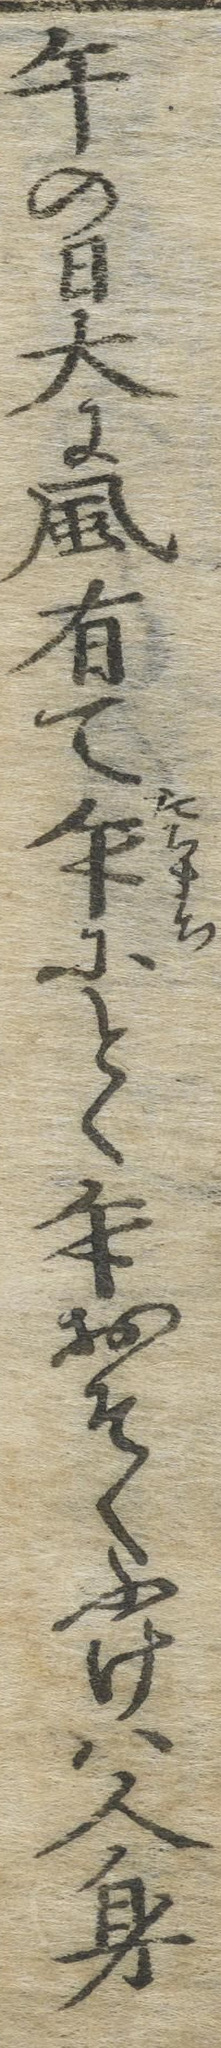午の日大に風有て乍にとく乍おそくふけは人身
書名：[晴雨考]
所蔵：東京大学地震研究所図書室 Earthquake Research Institute Library, The University of Tokyo, JAPAN
